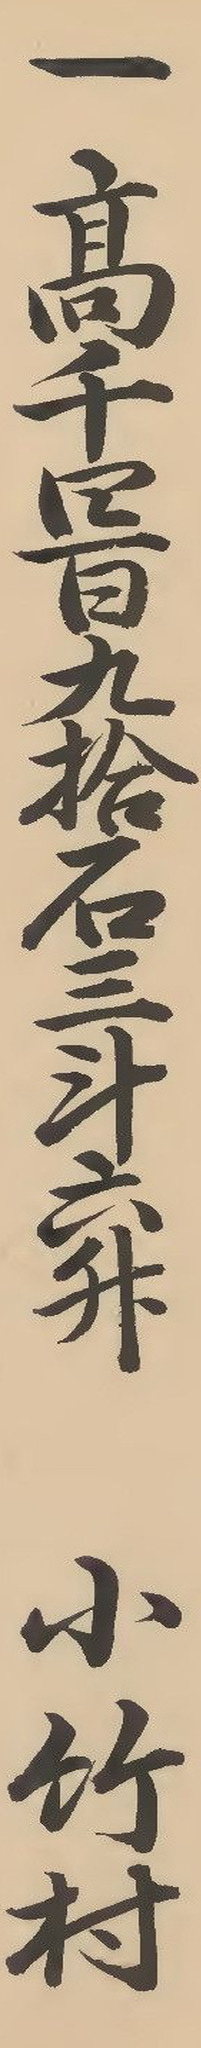一高千四百九拾石三斗六升小竹村
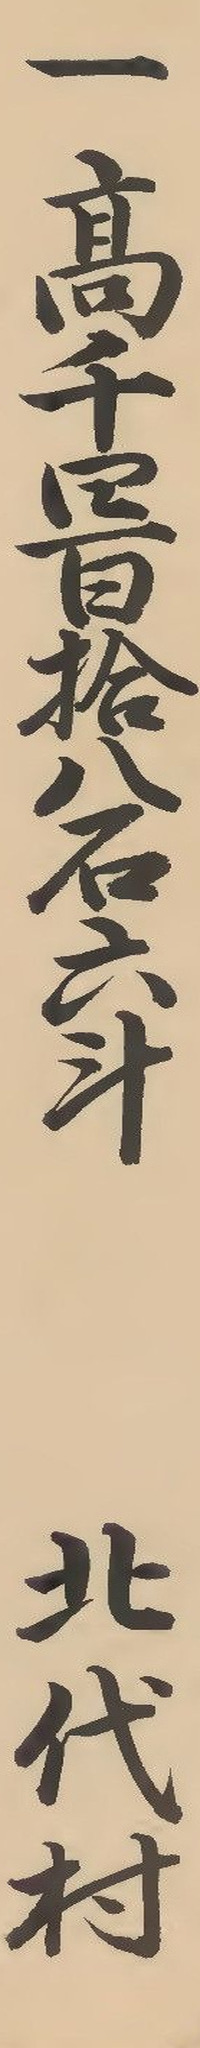一高千四百拾八石六斗北代村
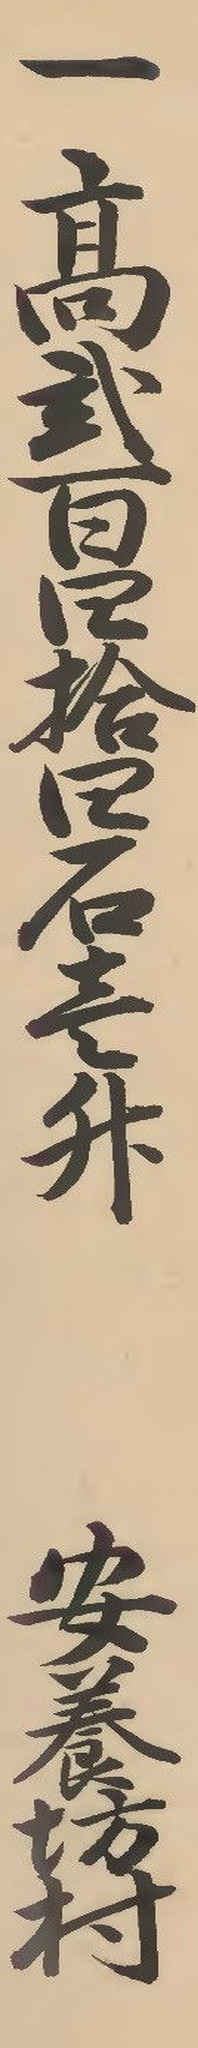一高弐百四拾四石壱升安養坊村
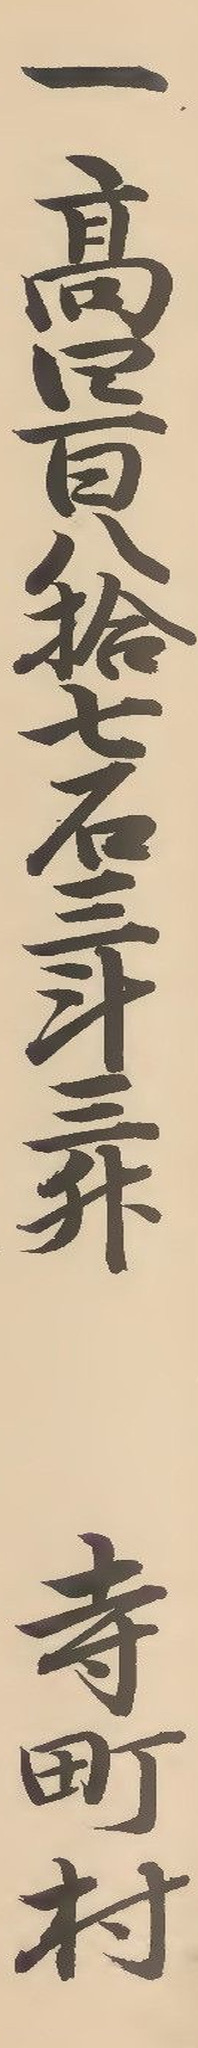一高四百八拾七石三斗三升寺町村
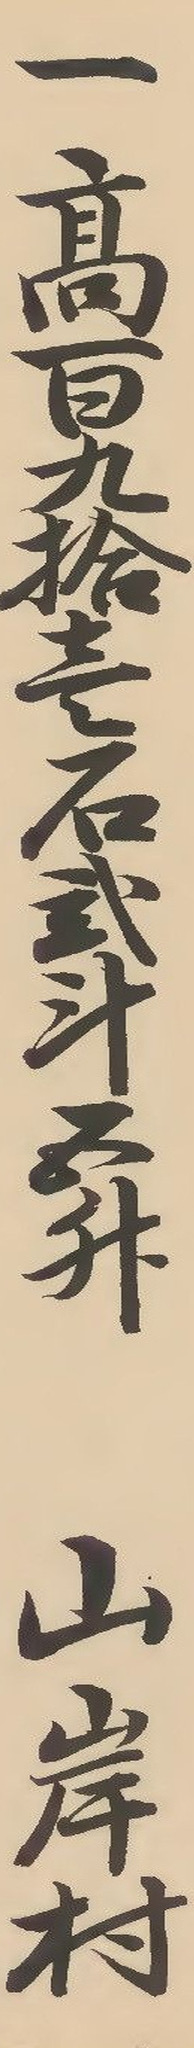一高百九拾壱石弐斗五升山岸村
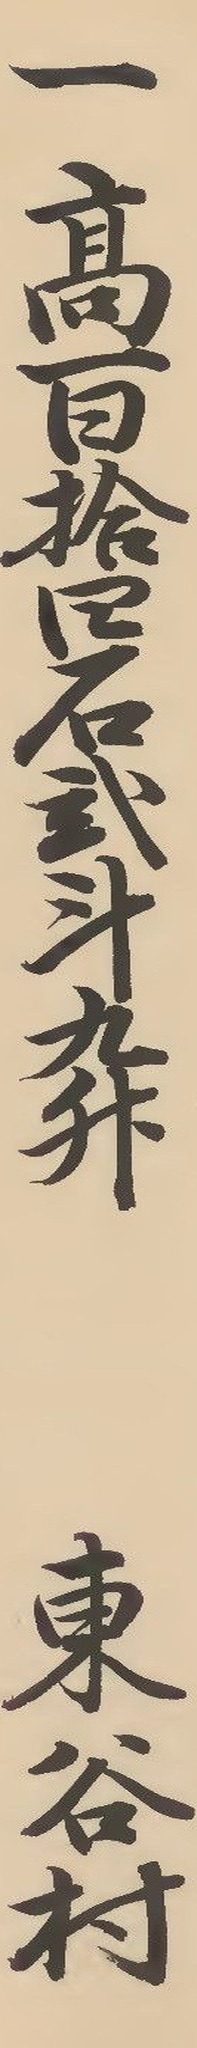一高百拾四石弐斗九升東谷村

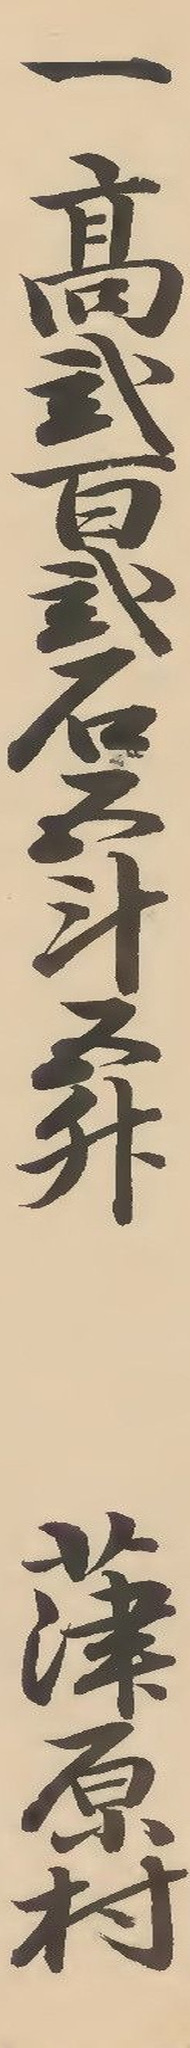一高弐百弐石五斗五升葎原村
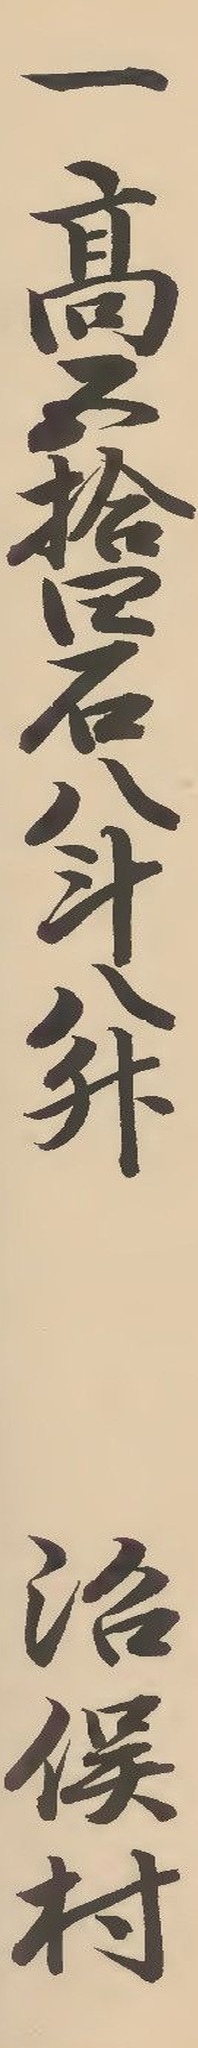一高五拾四石八斗八升治俣村
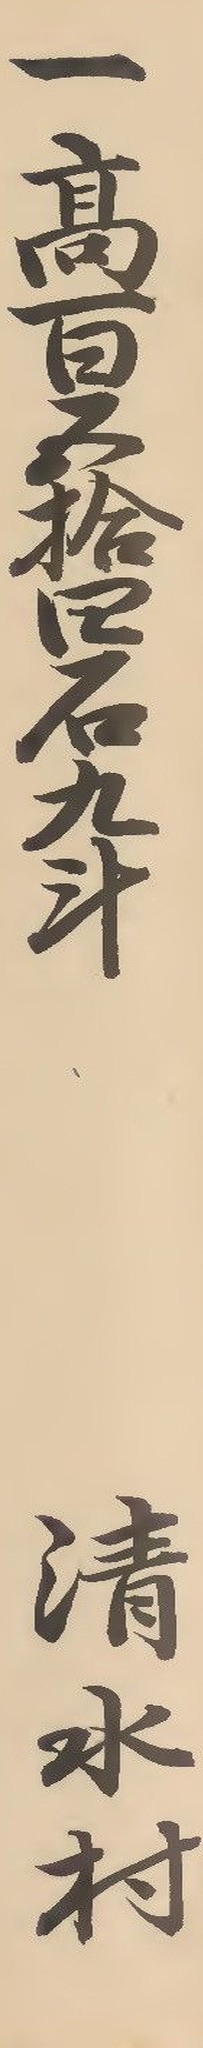一高百五拾四石九斗清水村
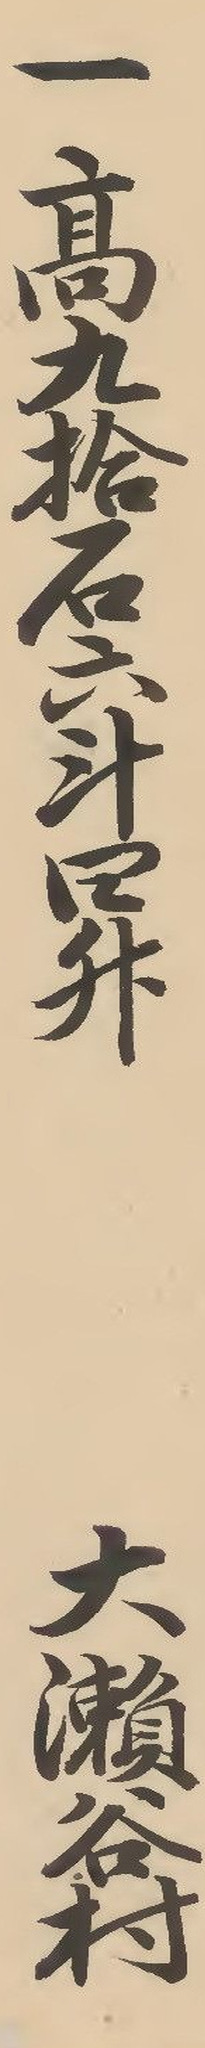一高九拾石六斗四升大瀬谷村
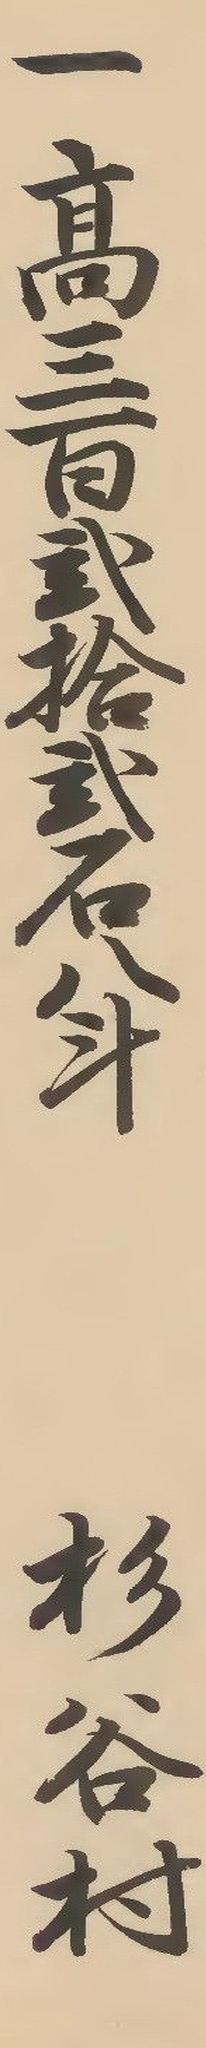一高三百弐拾弐石八斗杉谷村

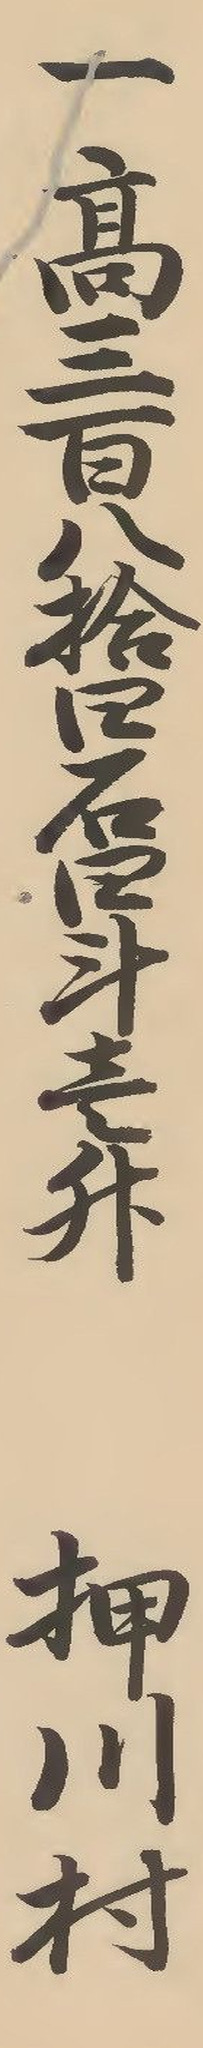一高三百八拾四石四斗壱升押川村
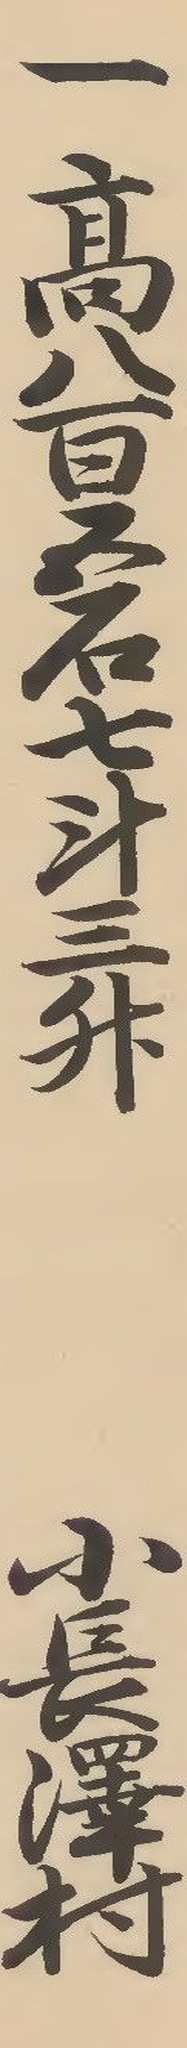一高八百五石七斗三升小長沢村
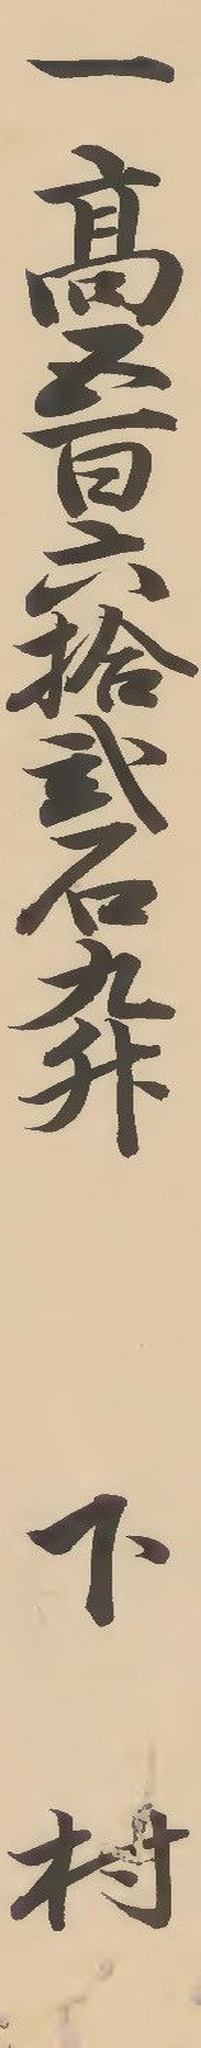一高五百六拾弐石九升下村
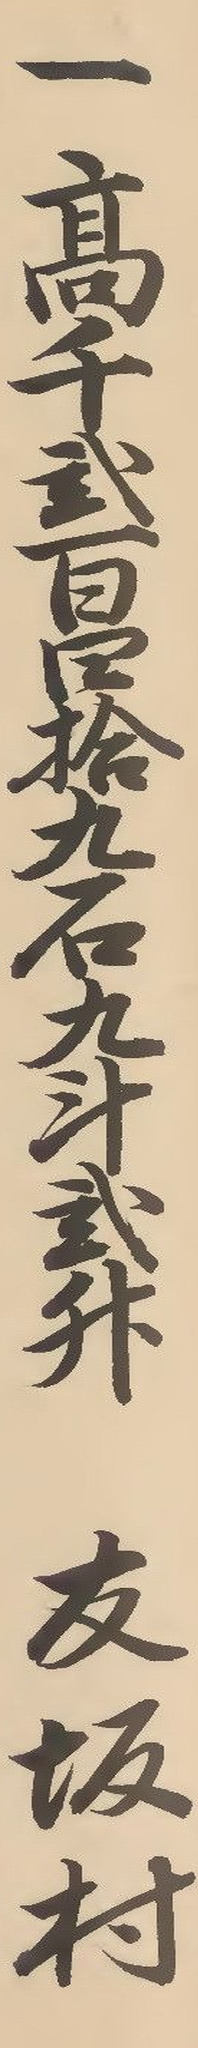一高千弐百四拾九石九斗弐升友坂村
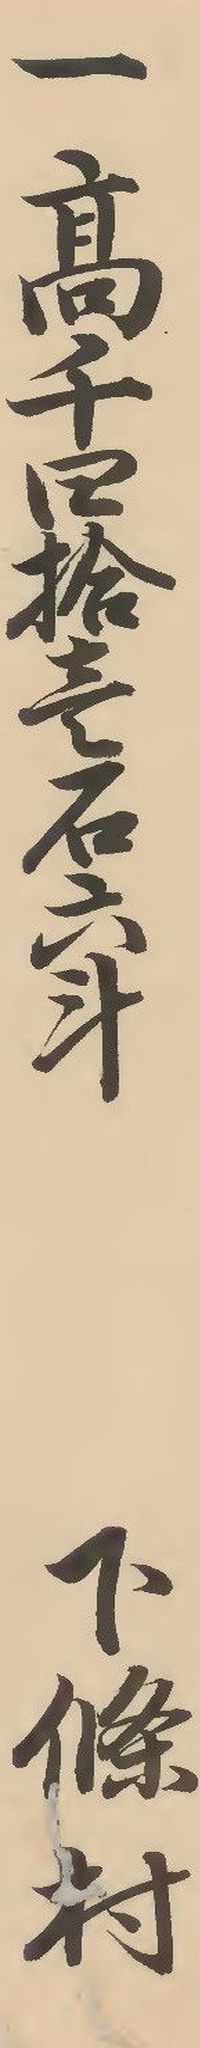一高千四拾壱石六斗下条村
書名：越中国郷帳
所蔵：国立公文書館 National Archives of Japan
